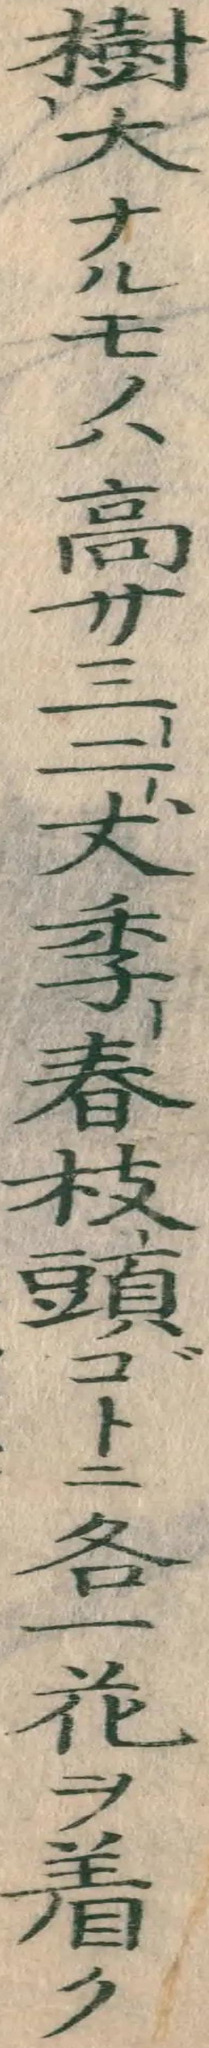樹-大ナルモノハ高サ三-二-丈季-春枝-頭ゴトニ各一花ヲ着ク
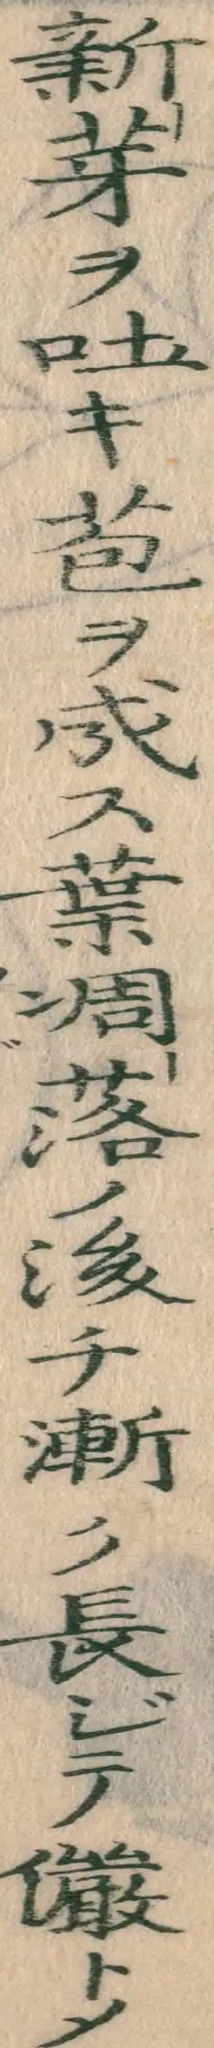新-芽ヲ吐キ苞ヲ成ス葉凋-落ノ後チ漸ク長ジテ儼トシテ
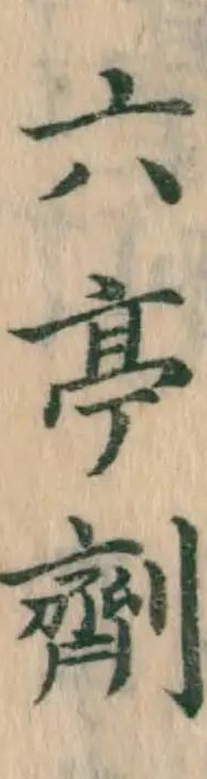六亭剤

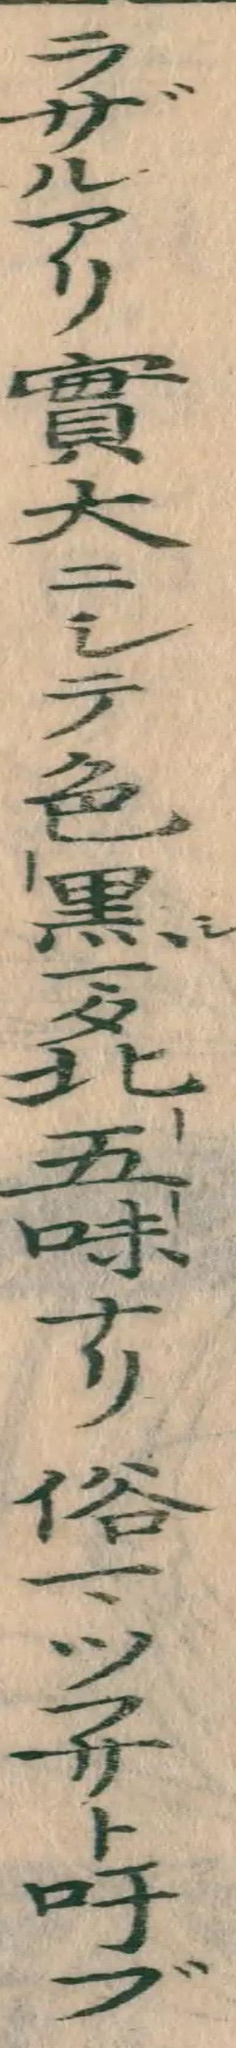ラザルアリ実大ニシテ色-黒マタ北-五-味ナリ俗マツフサト吁ブ

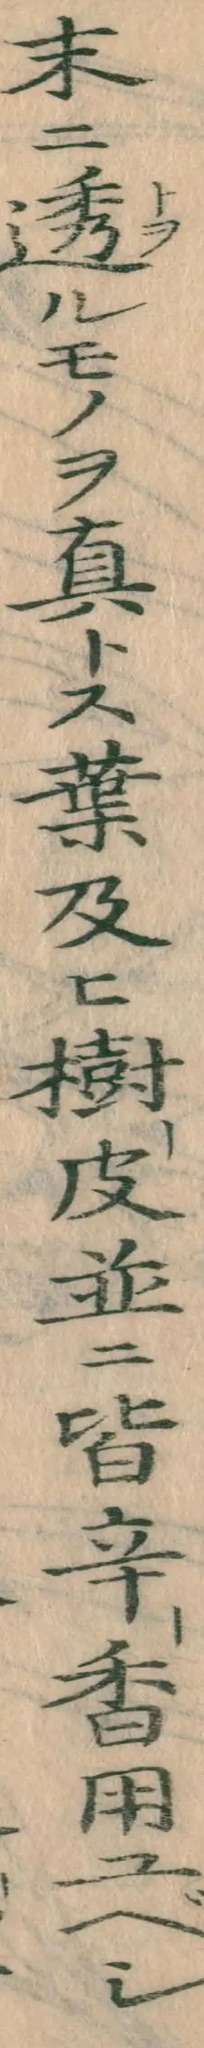末ニ透ルモノヲ真トス葉及ヒ樹-皮並ニ皆辛-香用ユベシ
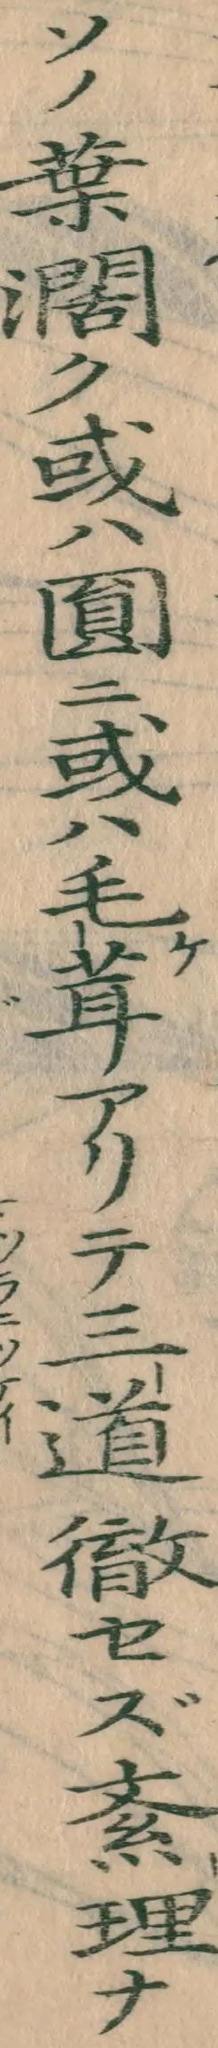ソノ葉闊ク或ハ円ニ或ハ毛-茸ケアリテ三-道徹セズ紊-理ナ
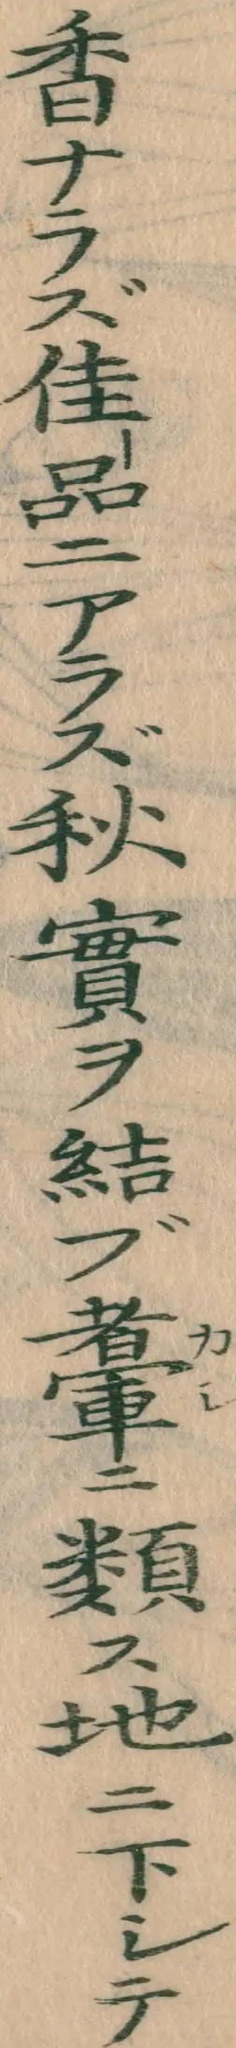香ナラズ佳-品ニアラズ秋実ヲ結ブ者軍ニ類ス地ニ下シテ
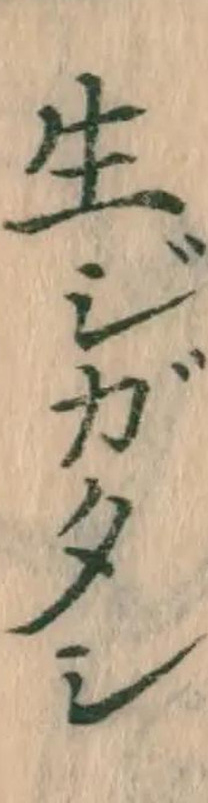生ジガタシ
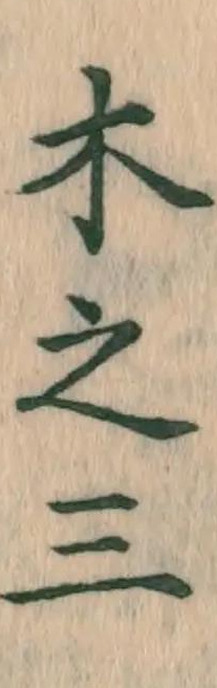木之三
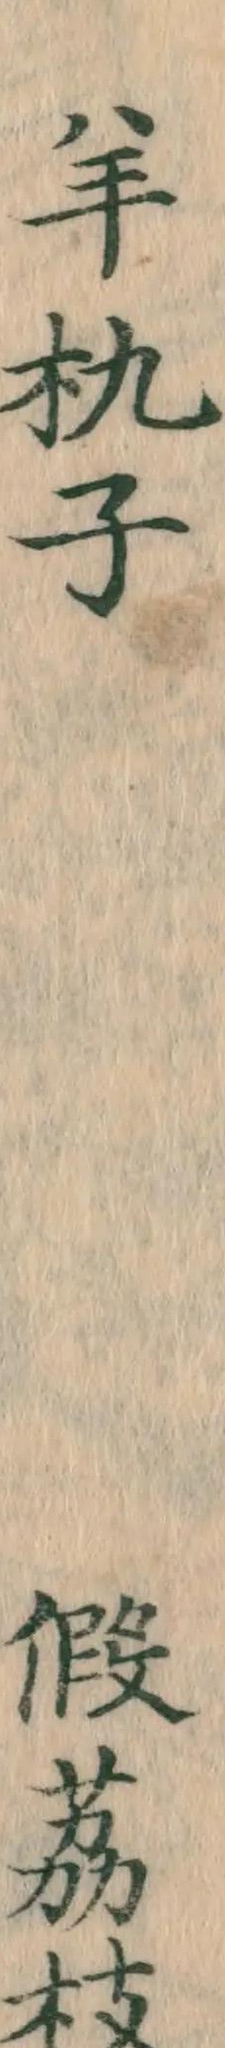羊朹子仮茘枝

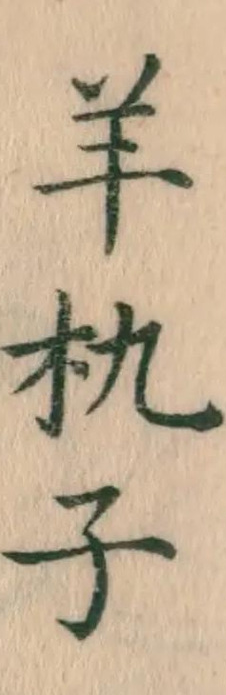羊朹子

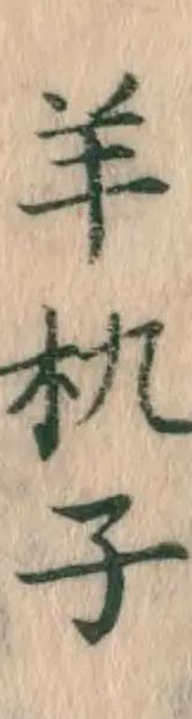羊朹子
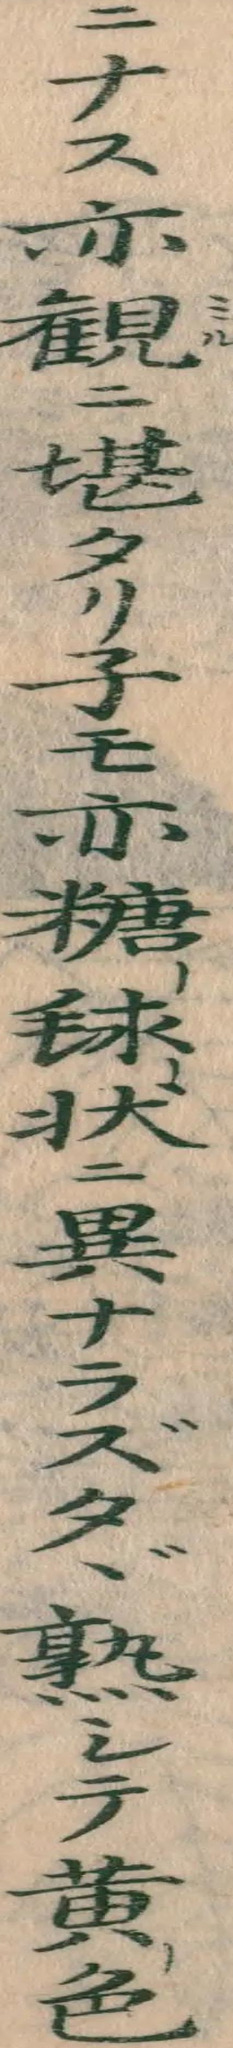ニナス亦観ニ堪タリ子モ亦糖-毬-状ニ異ナラズタヾ熟シテ黄-色
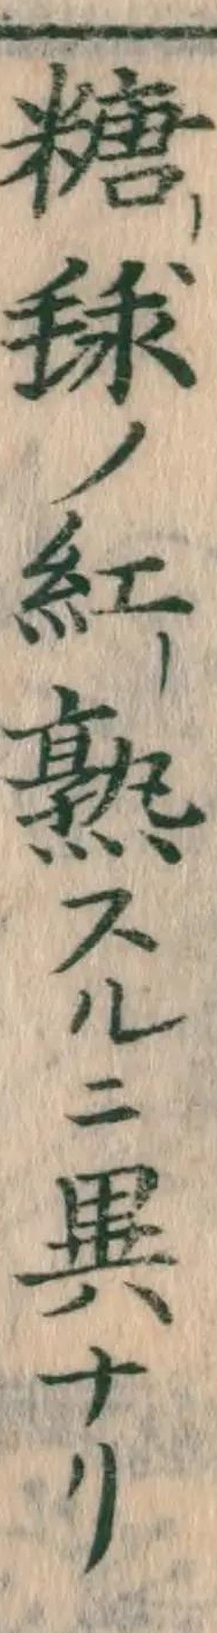糖-毬ノ紅-熟スルニ異ナリ
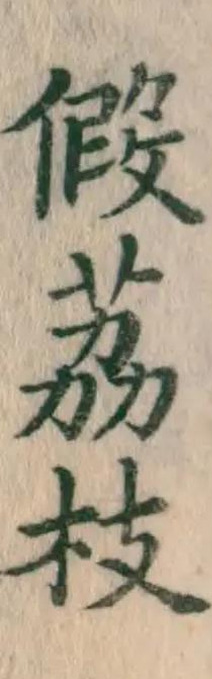仮茘枝

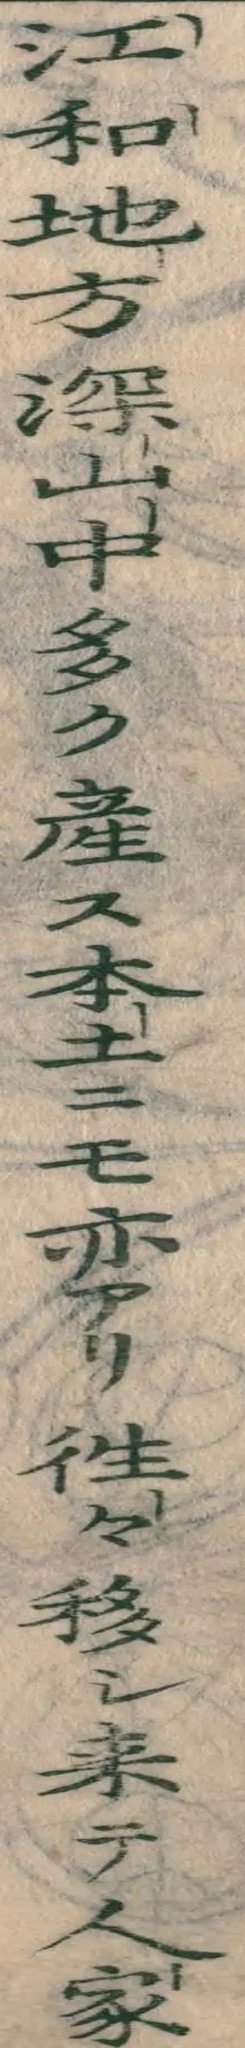江和地-方深-山-中多ク産ス本-土ニモ亦アリ往-々移シ来テ人-家
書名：花彙 草部4巻木部4巻. [2]
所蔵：国立国会図書館 National Diet Library, JAPAN
